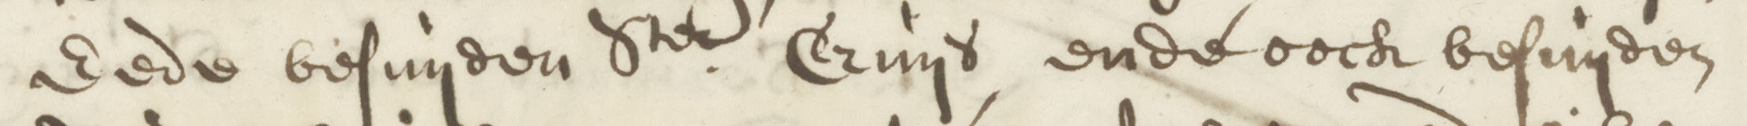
Eede besuyden Ste. Cruys, ende oock besuyden
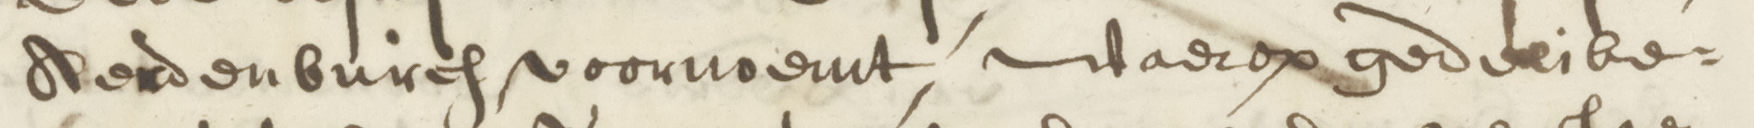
Aerdenburch voornoemt, Waerop gedelibe=
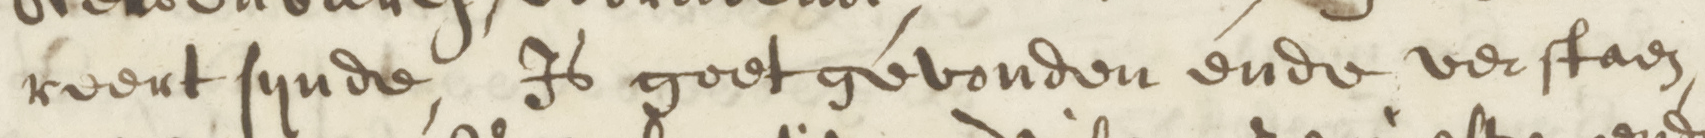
reert synde, Is goetgevonden ende verstaen
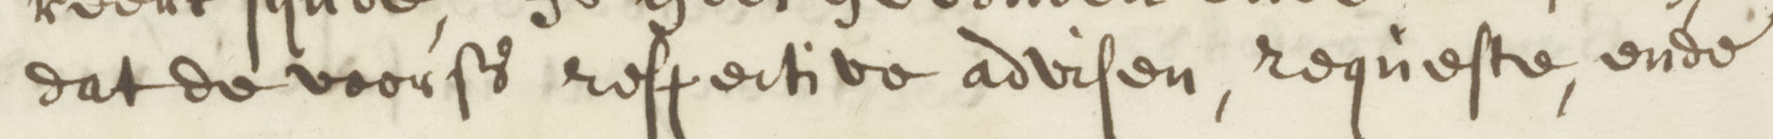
dat de voors respective advisen, requeste ende
